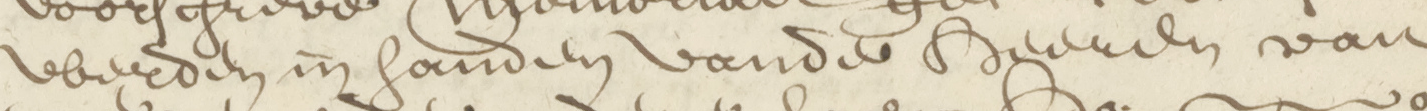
werden in handen vande Heeren van
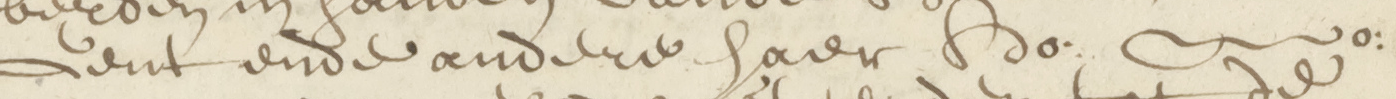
Gent ende andere haer Ho:Mo:
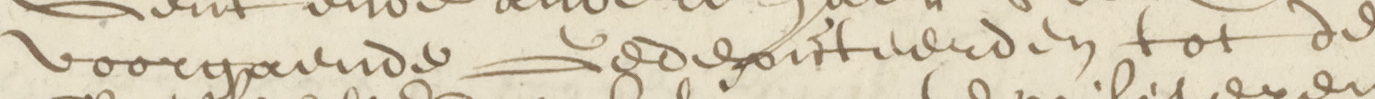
voorgaende Gedeputeerden tot de
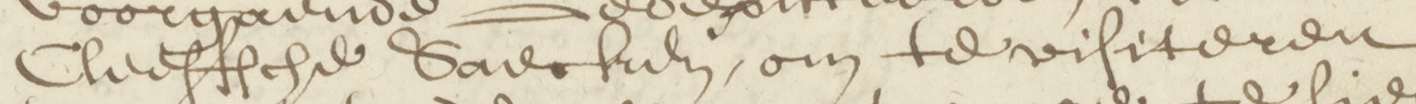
Cleeffsche Saecken, om te visiteren,
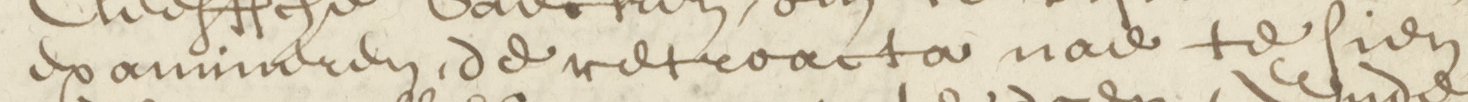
examineren, de retroacta nae te sien,
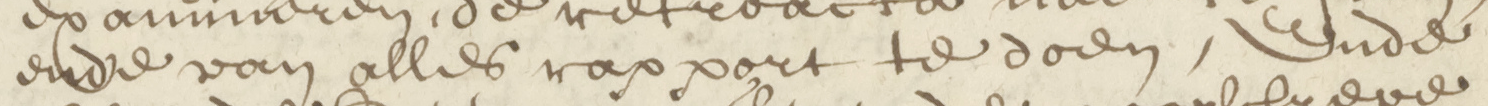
ende van alles rapport te doen, Ende
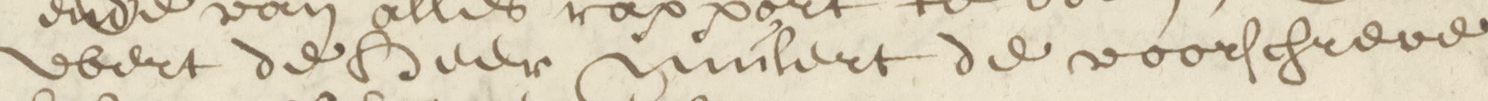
wert de Heer Mulert de voorschreve
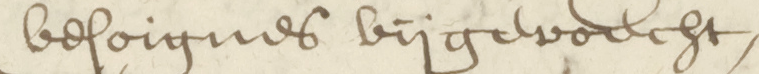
besoignes bijgevoecht.
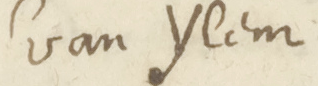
van Ylem
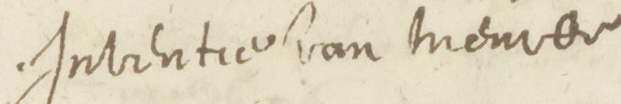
Inventie van niewe
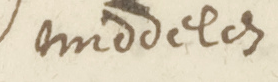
middelen
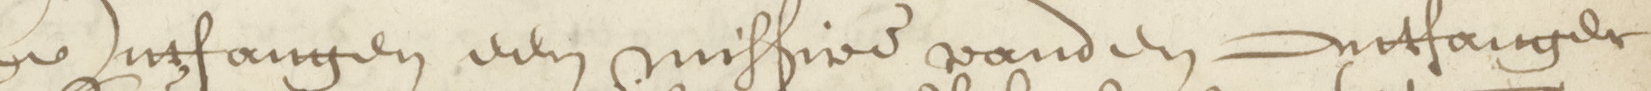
Ontfangen een missive vanden Ontfanger
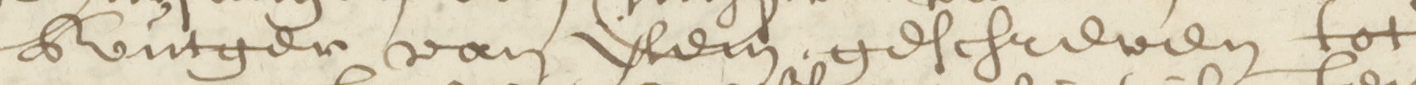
Rutger van Ylem, geschreven tot
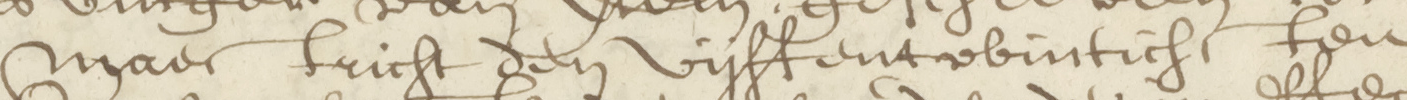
maestricht den vijffentwintichsten
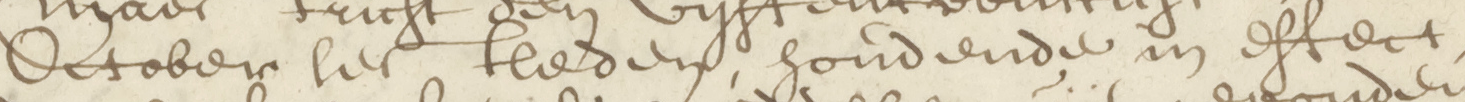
October lestleden, houdende in effect,
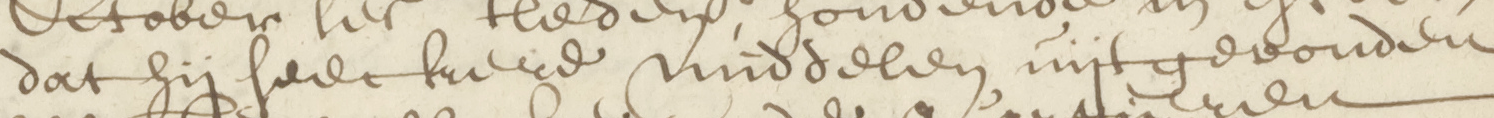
dat hij seeckere middelen uijtgevonden
